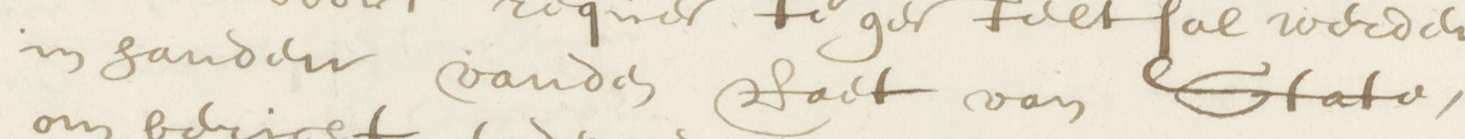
in handen vanden Raet van State,
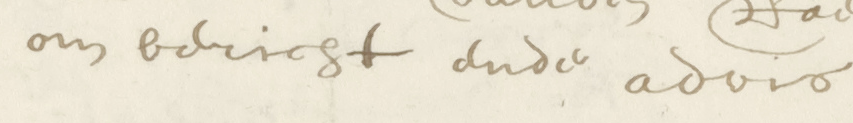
om bericht ende advis.
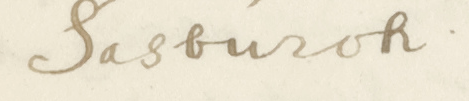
Sasburch.
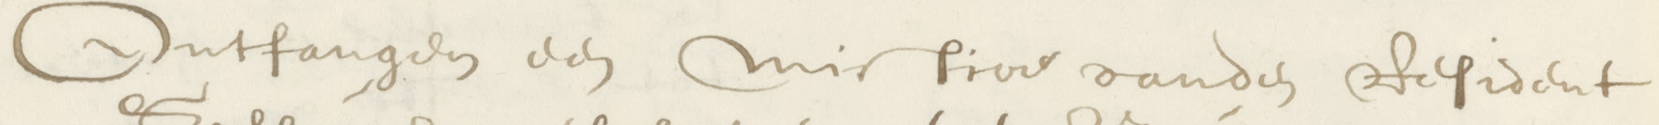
Ontfangen een Missive vanden Resident
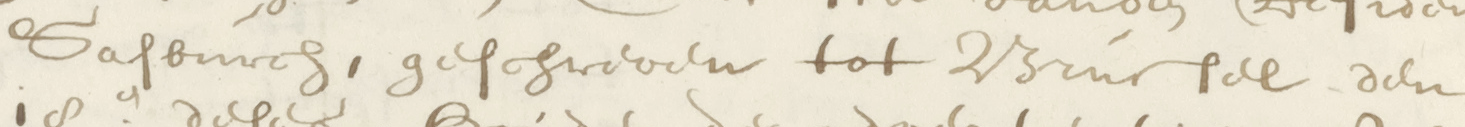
Sasburch, geschreven tot Brussel den
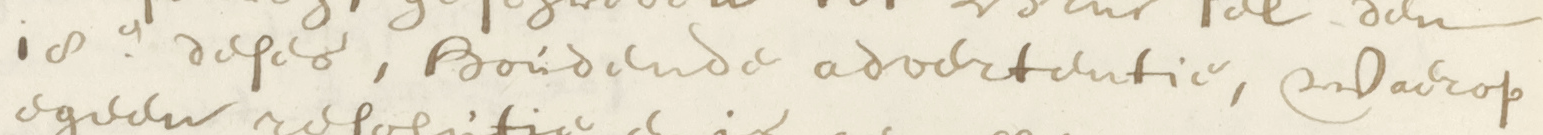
18e. deses, Houdende advertentie, Waerop
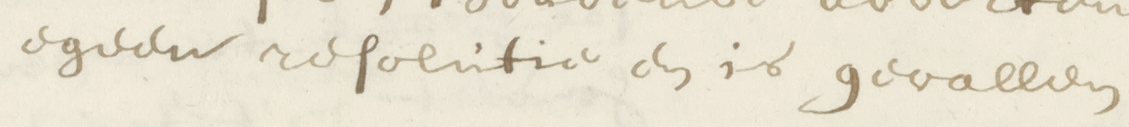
egeen resolutie en is gevallen.
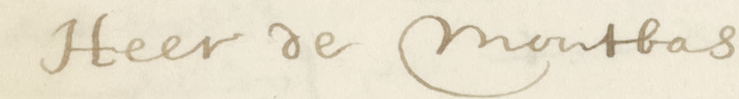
Heer de Montbas
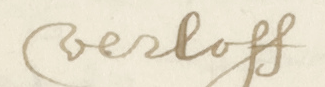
verloff.
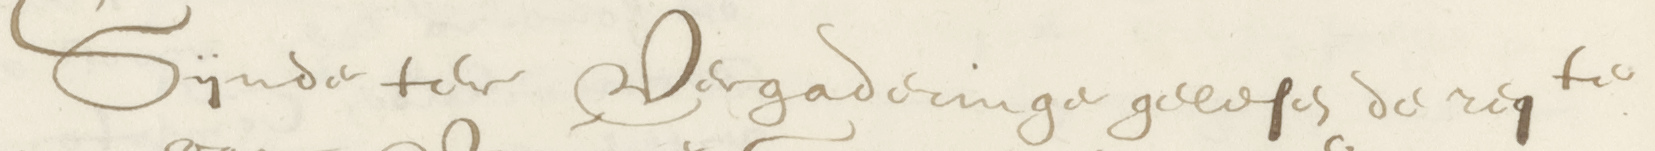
Sijnde ter Vergaderinge gelesen de reqte.
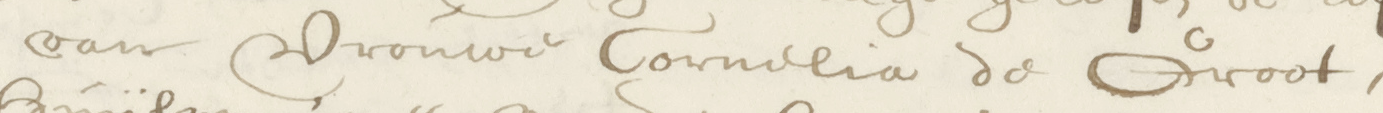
van Vrouwe Cornelia de Groot,
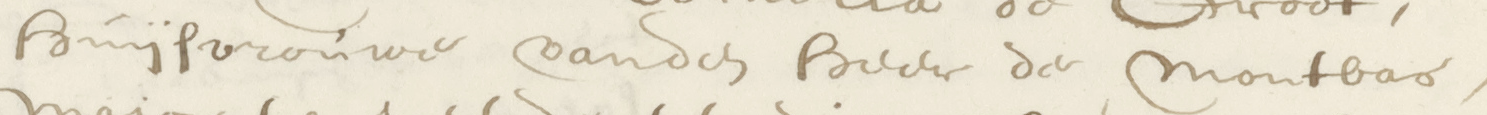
Huijsvrouwe vanden Heer de Montbas,
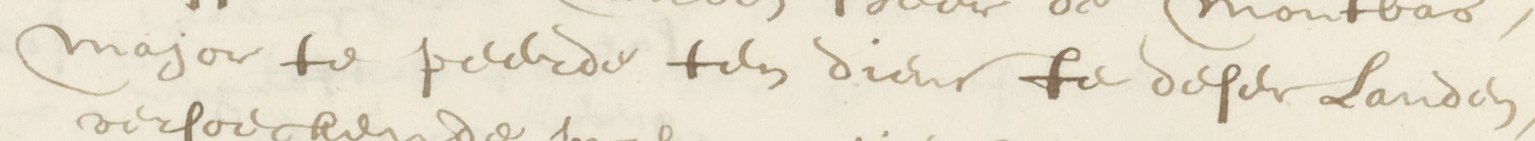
Major te peerde ten dienste deser Landen,
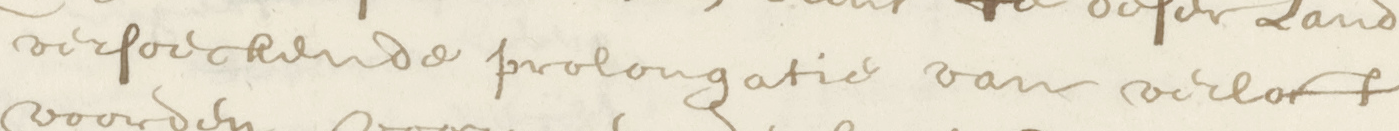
versoeckende prolongatie van verloff
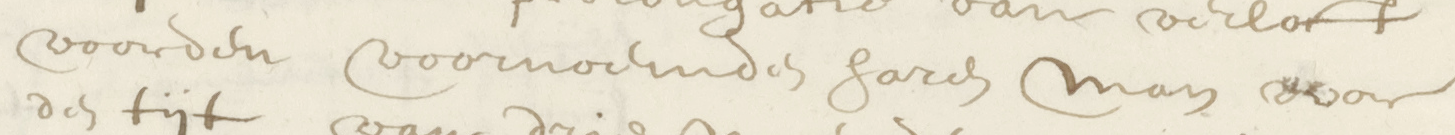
voorden voornoemden haren man voor
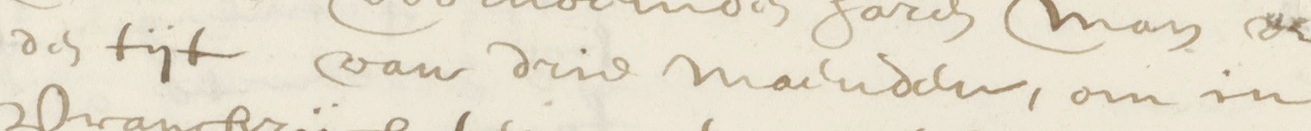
den tijt van drie maenden, om in
